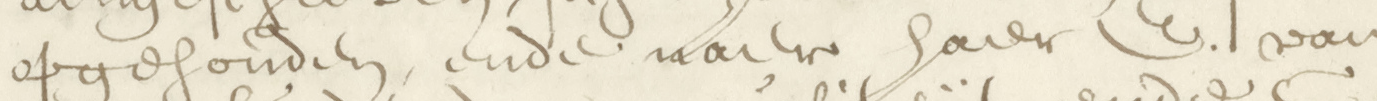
opgehouden, ende naer haer E. van
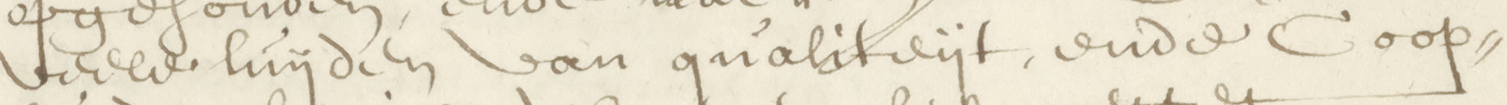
veele luijden van qualiteijt, ende Coop„
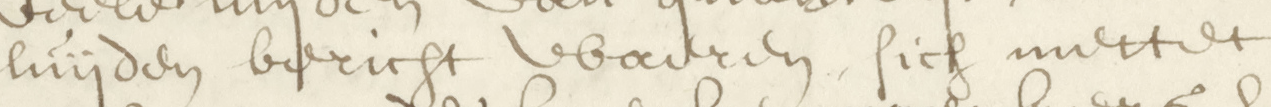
luijden bericht waeren, sich mettet
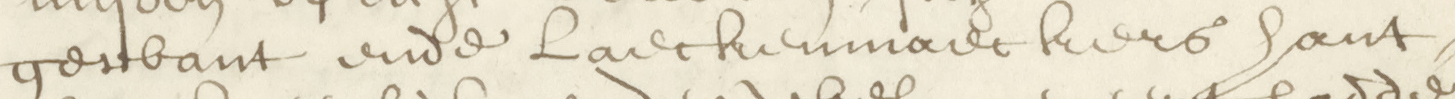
gewant ende Laeckenmaeckers hant„
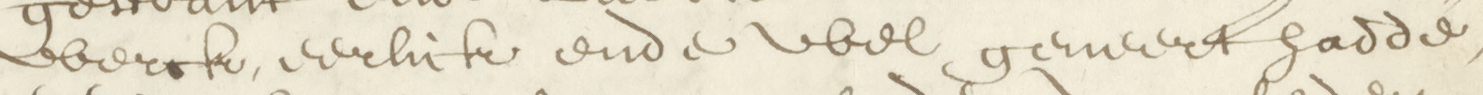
werck, eerlick ende wel geneert hadde,
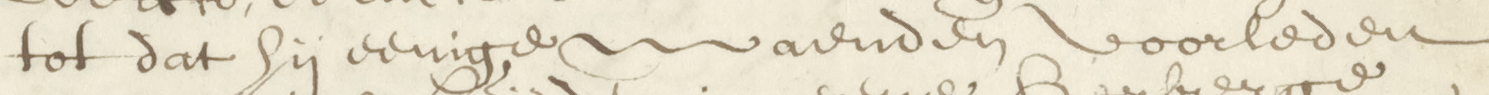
tot dat hij eenige maenden voorleden
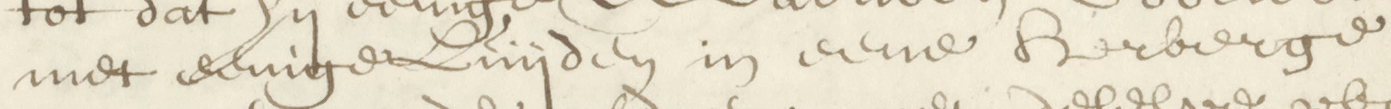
met eenige Luijden in eene Herberge
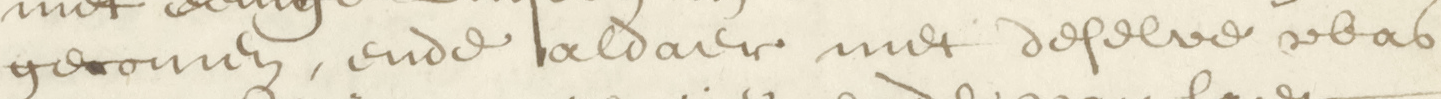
gecomen, ende aldaer met deselve was
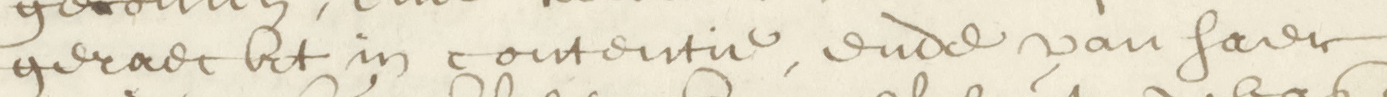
geraeckt in contentie, ende van haer
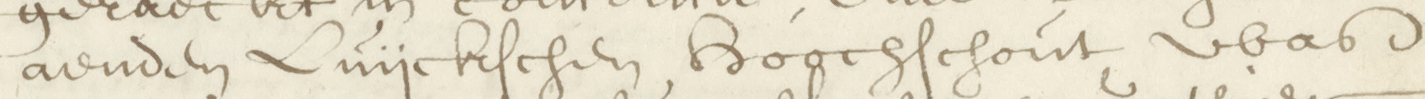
aenden Luijckschen Hoochschout Was
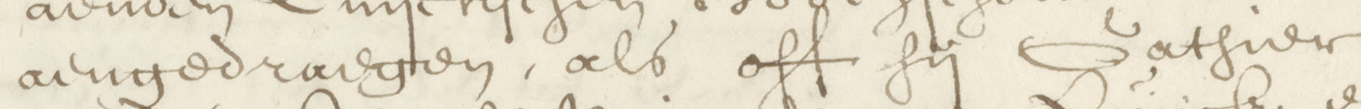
aengedraegen, als off hij Gathier
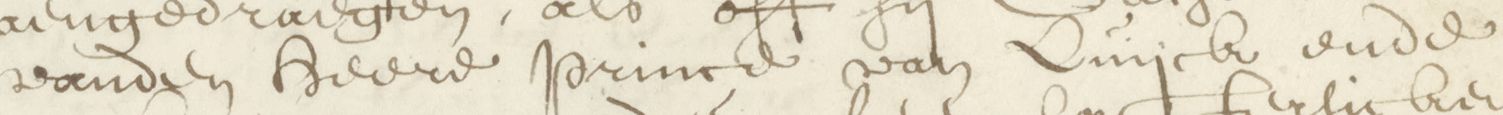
vanden Heere Prince van Luijck ende
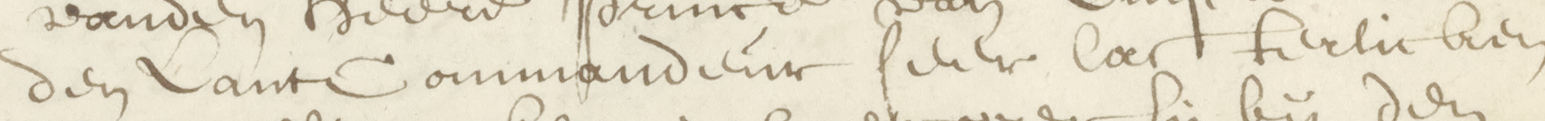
den Lant Commandeur seer lasterlicken
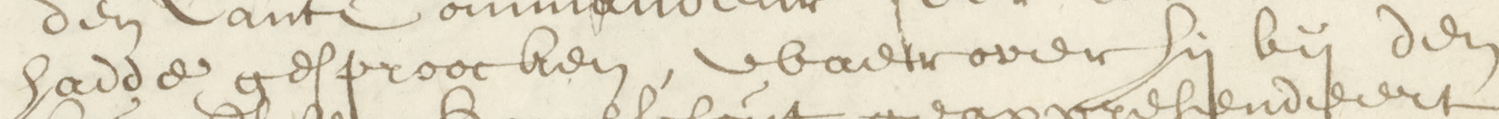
hadde gesproocken, waerover hij bij den
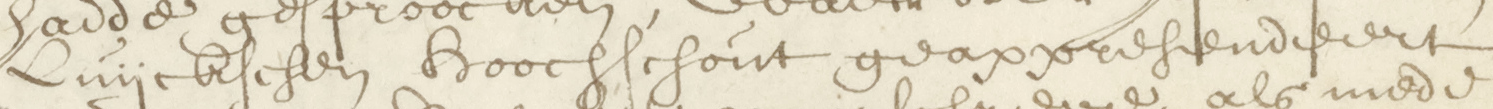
Luijckschen Hoochschout geapprehendeert
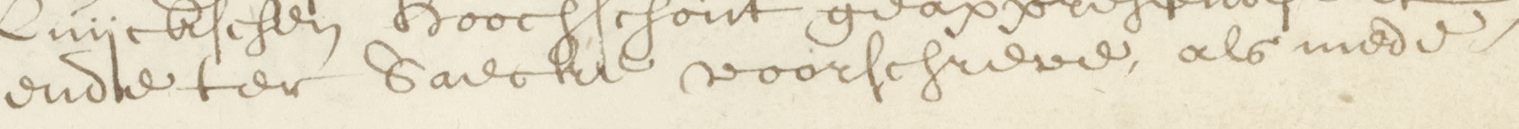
ende ter Saecke voorschreve, als mede
